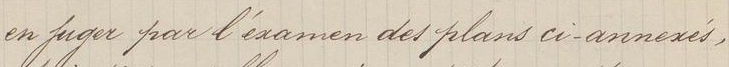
en juger par l'examen des plans ci-annexés,
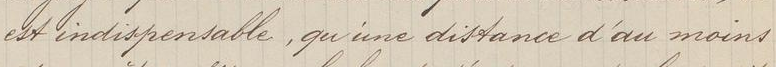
est indispensable, qu'une distance d'au moins
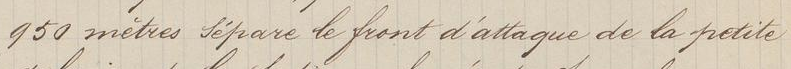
950 mètres sépare le front d'attaque de la petite
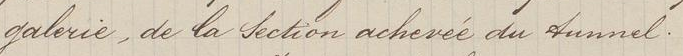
galerie, de la Section achevée du tunnel.
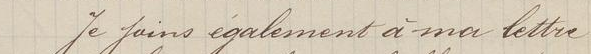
Je joins également à ma lettre
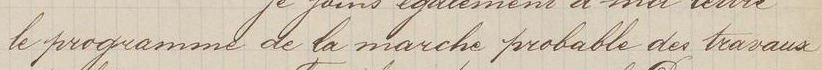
le programme de la marche probable des travaux
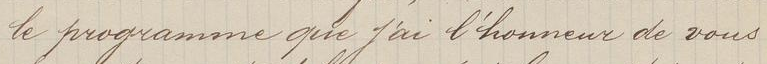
le programme que j'ai l'honneur de vous
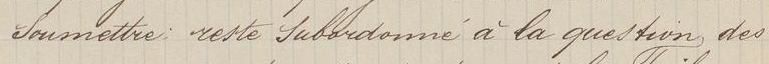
soumettre, reste subordonné à la question des
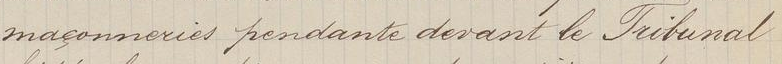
maçonneries pendante devant le Tribunal
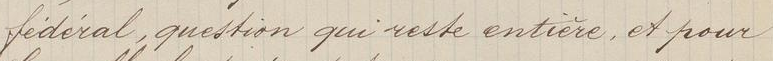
fédéral, question qui reste entière, et pour
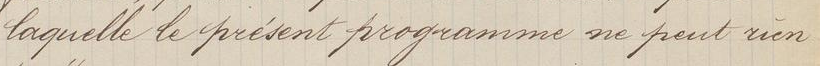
laquelle le présent programme ne peut rien
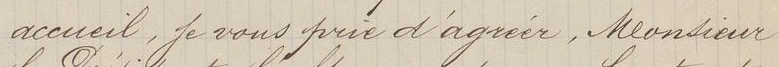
accueil, je vous prie d'agréer, Monsieur
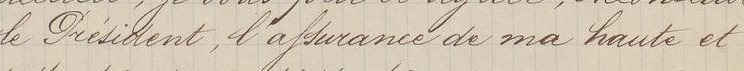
le Président, l'assurance de ma haute et
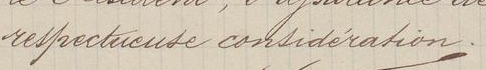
respectueuse considération.
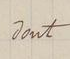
dont 2
